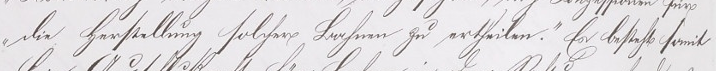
die Herstellung solcher Bahnen zu ertheilen.» Es besteht somit
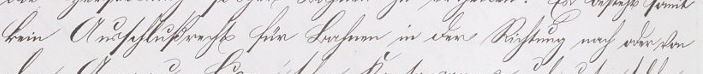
kein Ausschlußrecht für Bahnen in der Richtung nach oder von
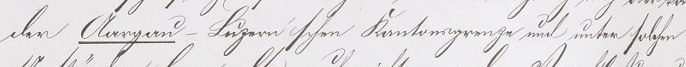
der Aargau–Luzern'schen Kantonsgrenze und unter solchen
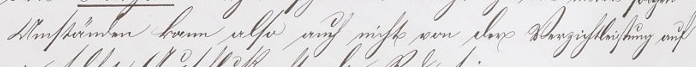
Umständen kann also auch nicht von der Verzichtleistung auf
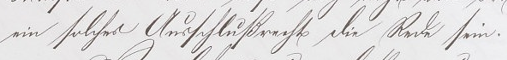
ein solches Ausschlußrecht die Rede sein.
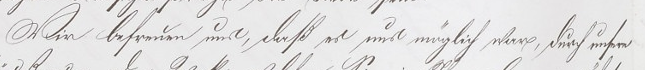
Wir befreuen uns, daß es uns möglich war, durch unsere
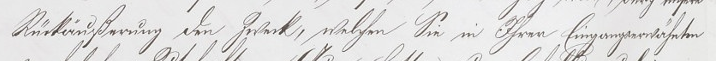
Rückäußerung den Zweck, welchen Sie in Ihrer Eingangserwähnten
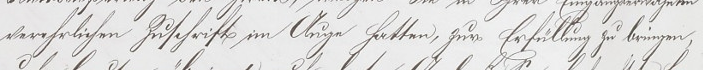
verehrlichen Zuschrift im Auge hatten, zur Erfüllung zu bringen,
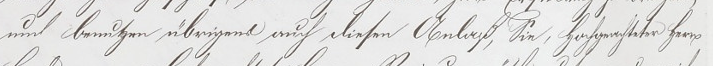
und benutzen übrigens auch diesen Anlaß, Sie, Hochgeachteter Herr
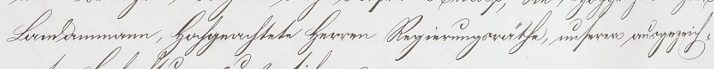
Landammann, Hochgeachtete Herren Regierungsräthe, unserer ausgezeich-
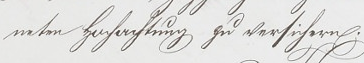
neten Hochachtung zu versichern.
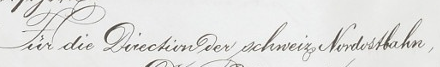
Für die Direction der schweiz. Nordostbahn,
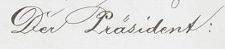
Der Präsident:
